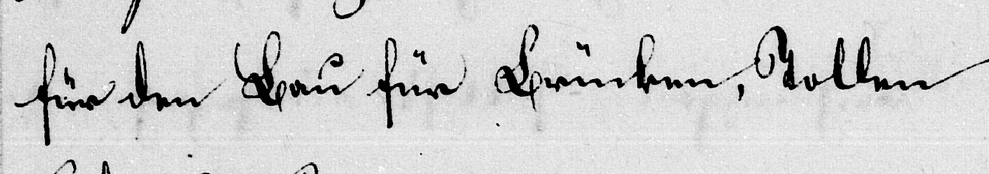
für den Bau für Brücken, Tollen
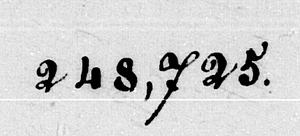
248,725.
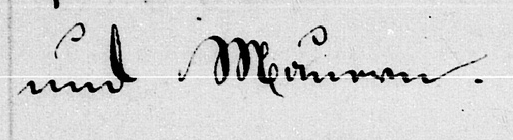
und Mauern
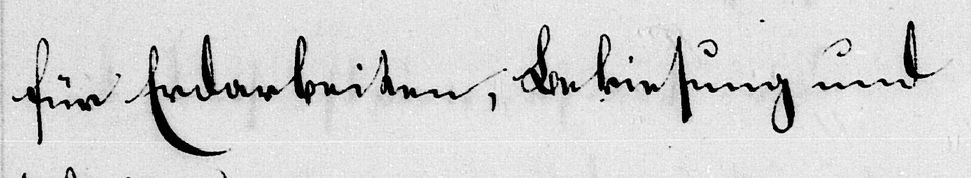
Für Erdarbeiten, Bekiesung und
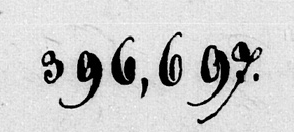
396,697.
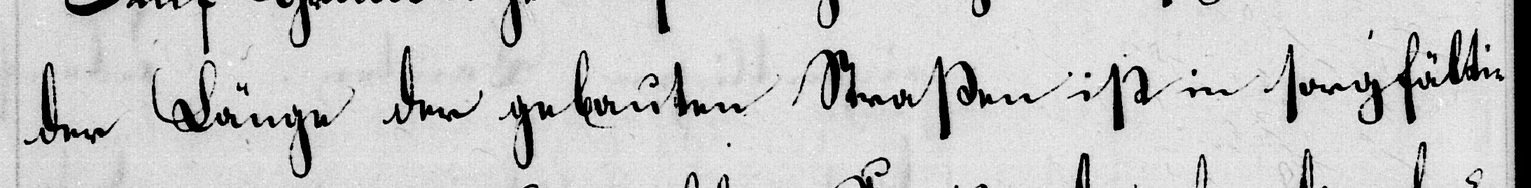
der Länge der gebauten Straßen ist in sorgfälti¬
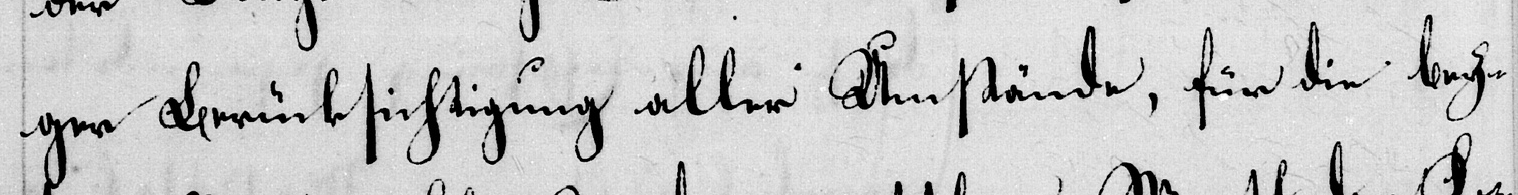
ger Berücksichtigung aller Umstände, für die bey¬
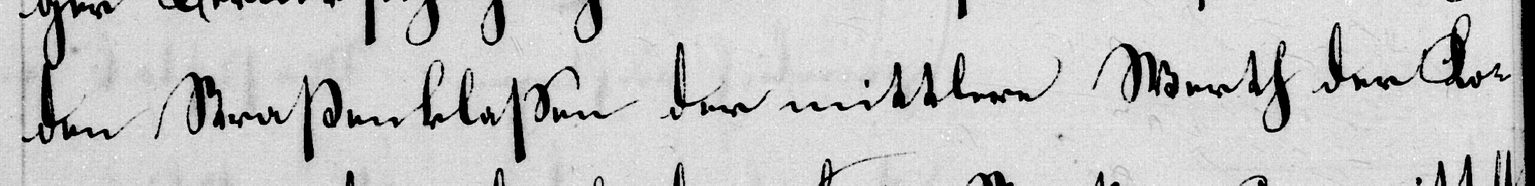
den Straßenklaßen der mittlere Werth der Ko¬
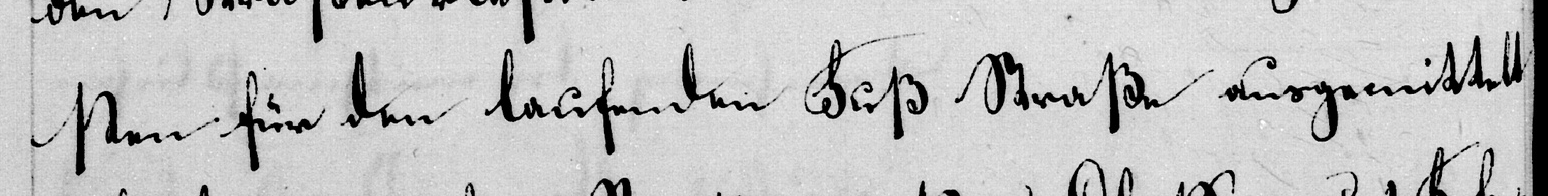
sten für den laufenden Fuß Straße ausgemittelt
